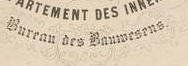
Bureau des Bauwesens.
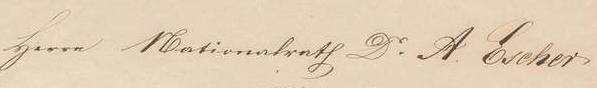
Herrn Nationalrath Dr A. Escher
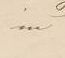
in
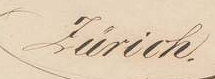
Zürich.
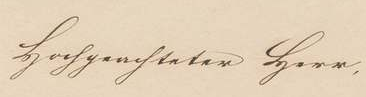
Hochgeachteter Herr,
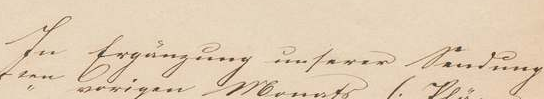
In Ergänzung unserer Sendung
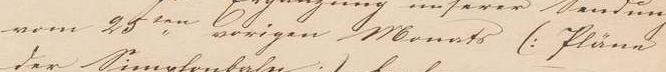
vom 25ten vorigen Monats (Pläne
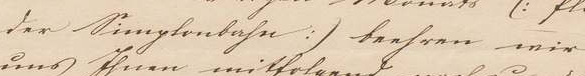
der Simplonbahn) beehren wir
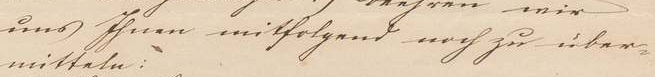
uns Ihnen mitfolgend noch zu über-
